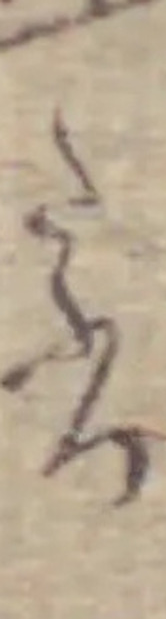たふつ
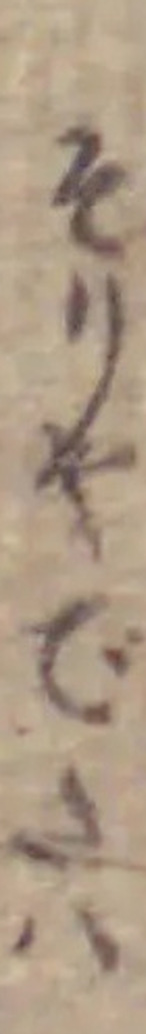そりやでたは

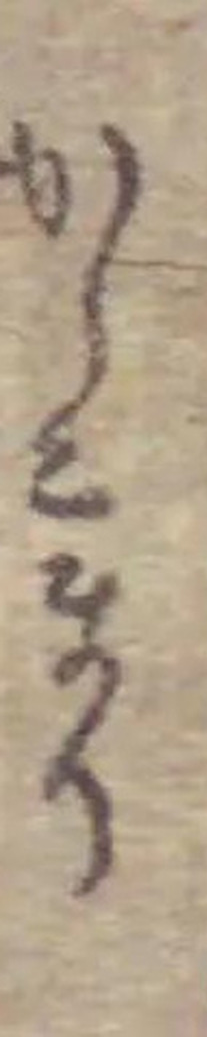かしこまり
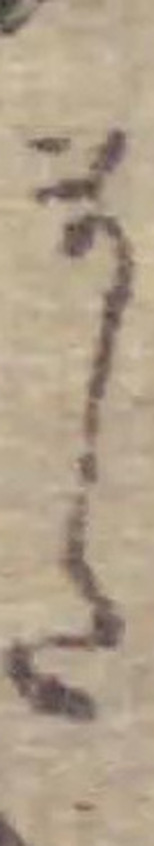ました
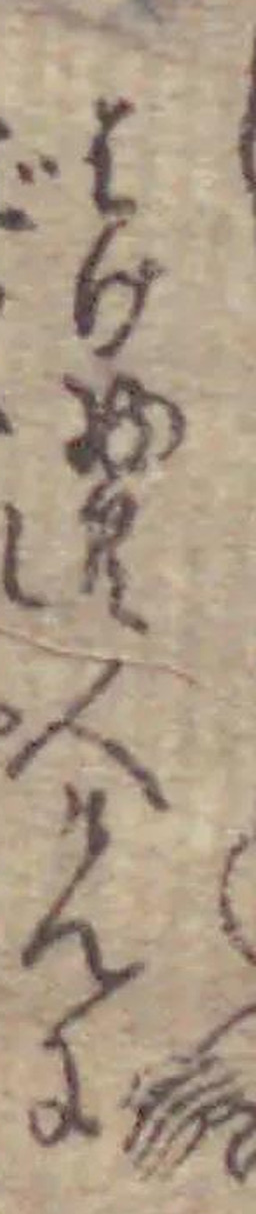はけ物共人けんに
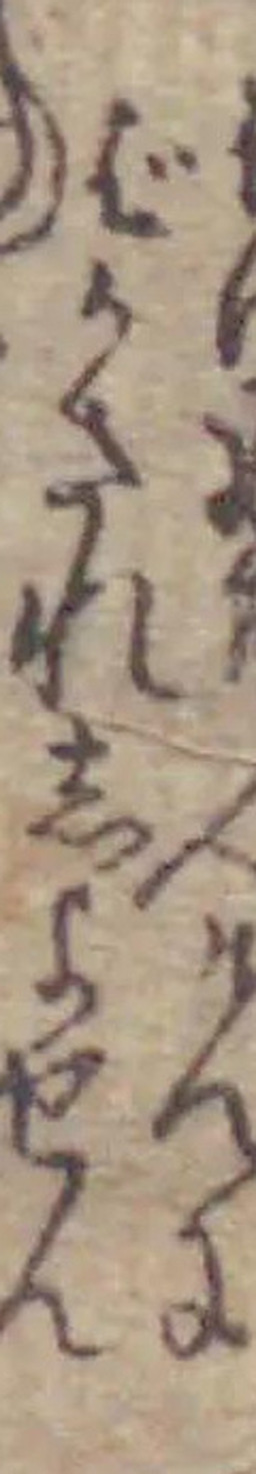ばかされしよせん
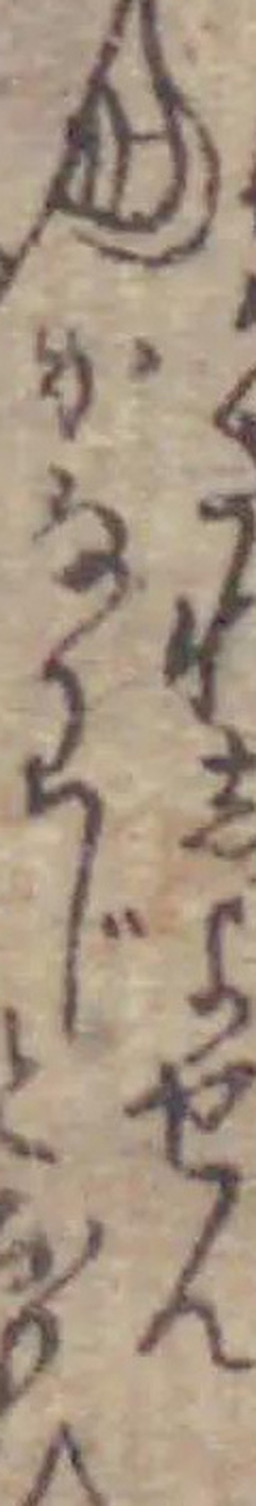かなわじとおもひ
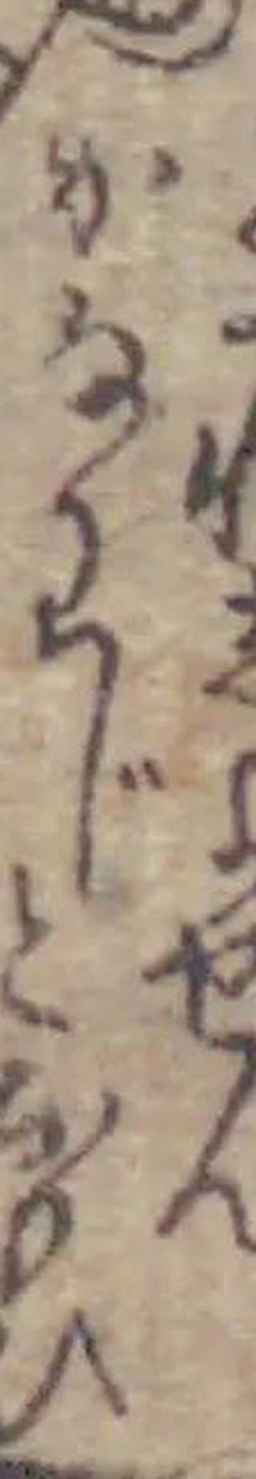かなわじとおもひ
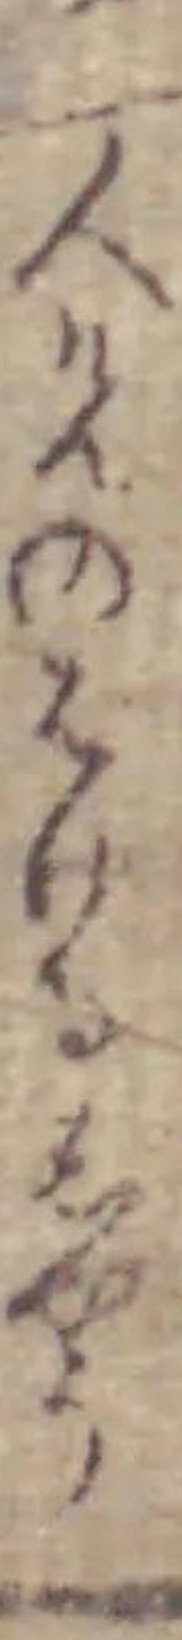人けんのはけるしやう
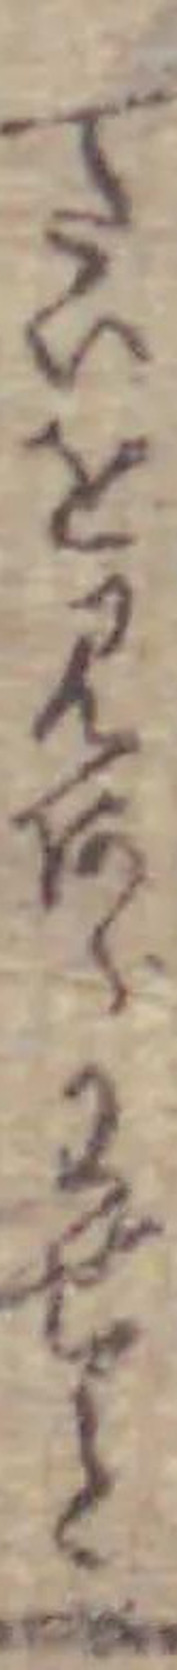たいを見あらわせと
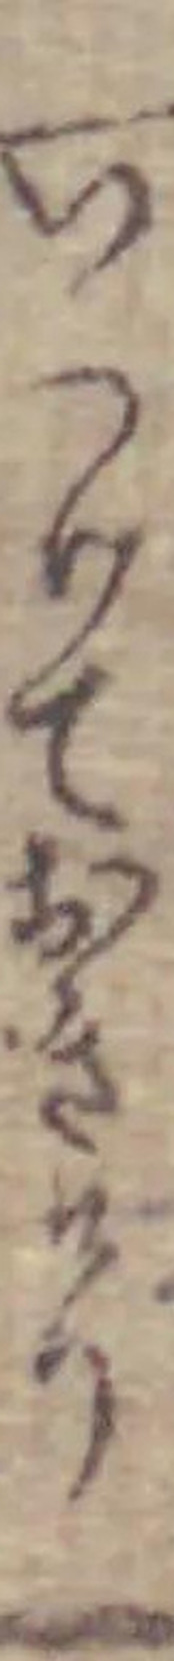いつけておきけり
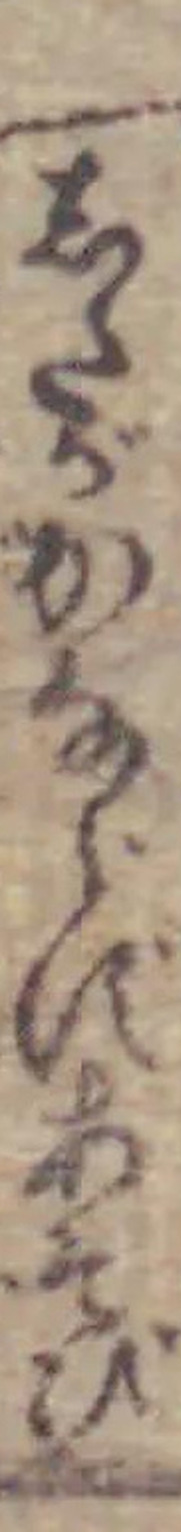したがかならずあそび
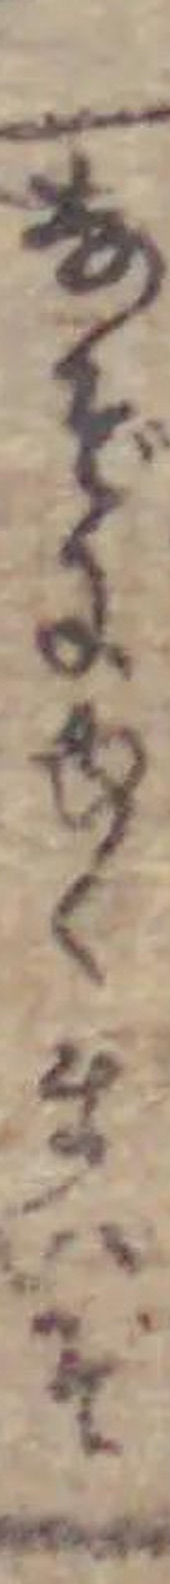なぞにゆくまいぞ
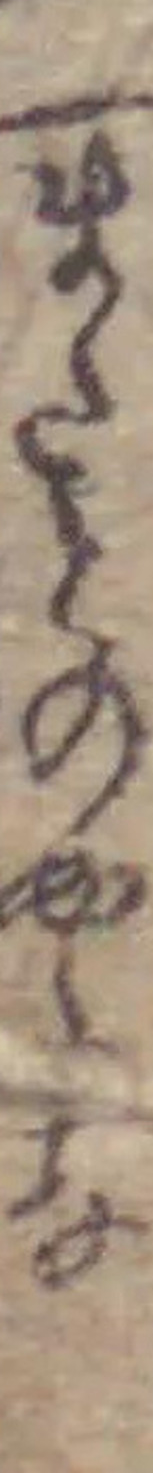またとのやな
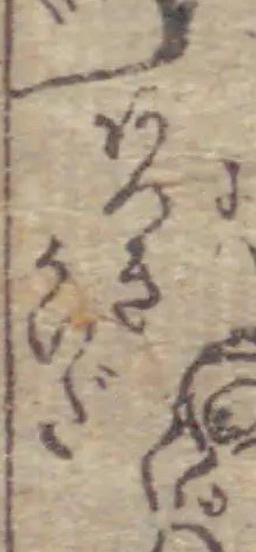あつき
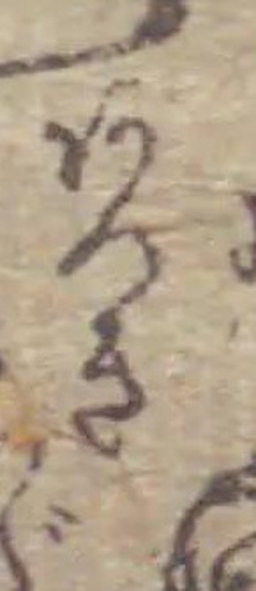あつき
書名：化物箱根先 2巻
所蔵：国立国会図書館 National Diet Library, JAPAN
